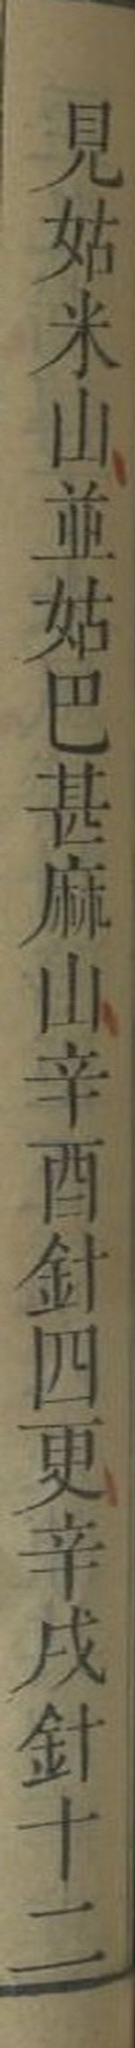見姑米山並姑巴甚麻山辛酉針四更辛戌針十二
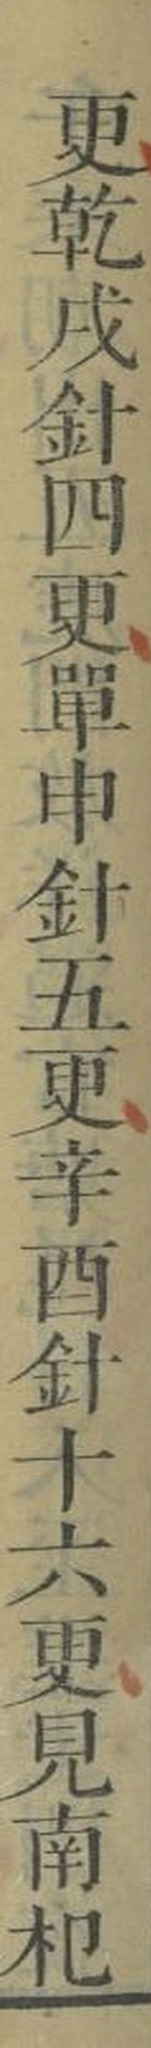更乾戌針四更單申針五更辛酉針十六更見南杞
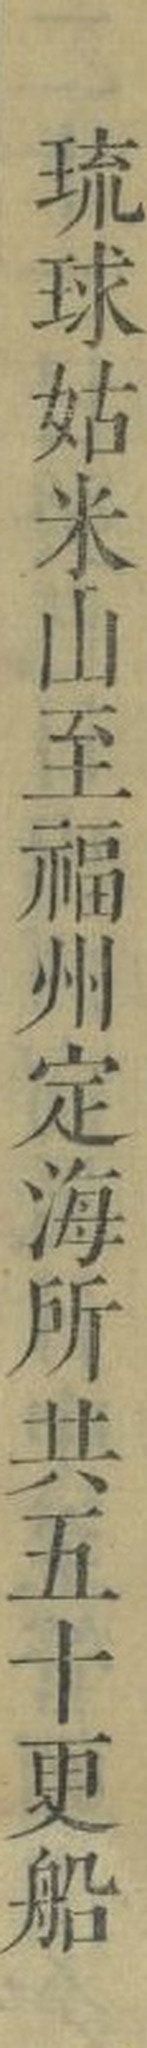琉球姑米山至福州定海所共五十更船
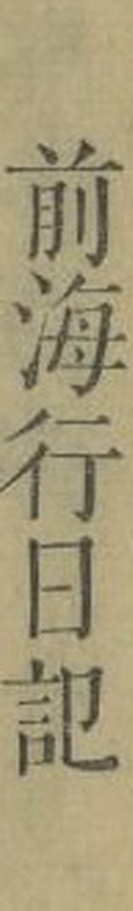前海行日記
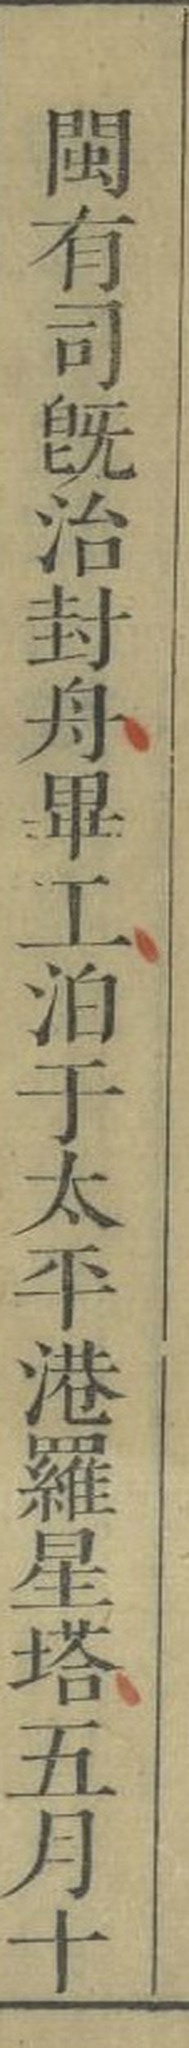閩有司既治封舟畢工泊于太平港羅星塔五月十
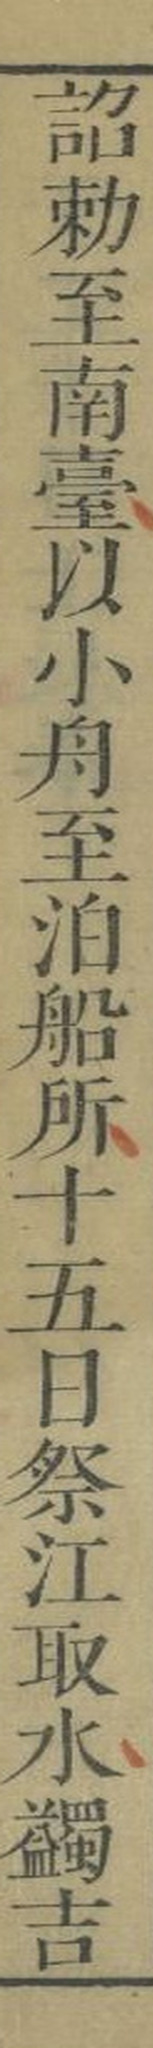詔勅至南臺以小舟至泊船所十五日祭江取水蠲吉

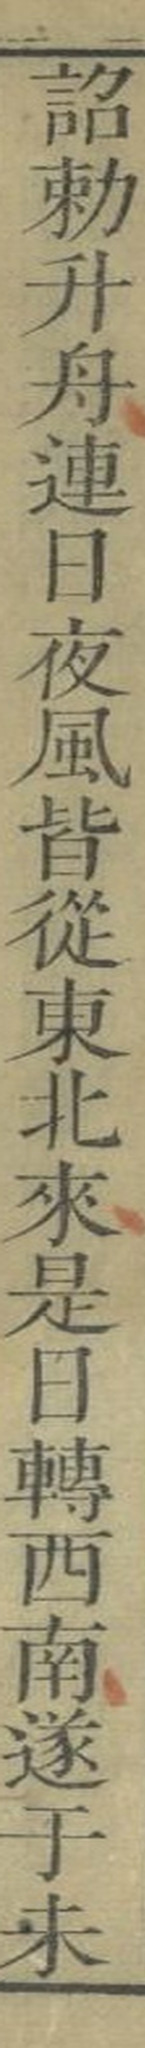詔勅升舟連日夜風皆從東北來是日轉西南遂于未
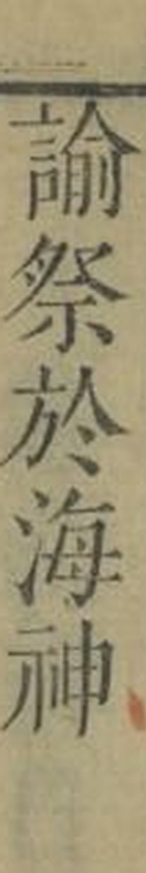諭祭於海神
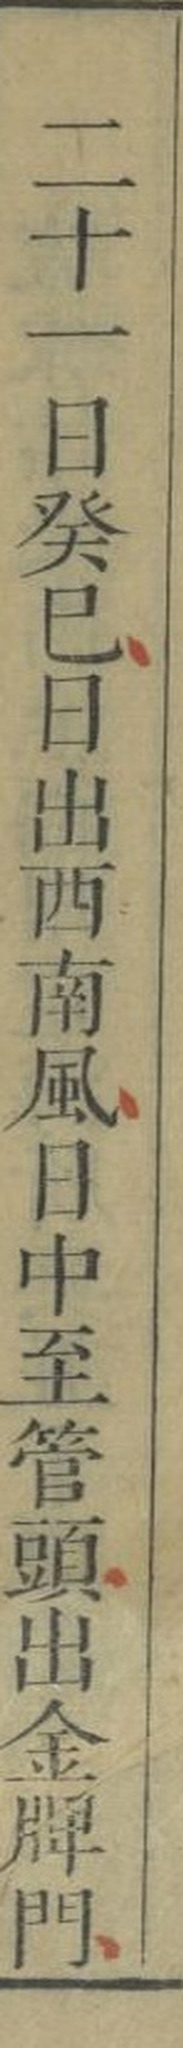二十一日癸巳日出西南風日中至管頭出金牌門
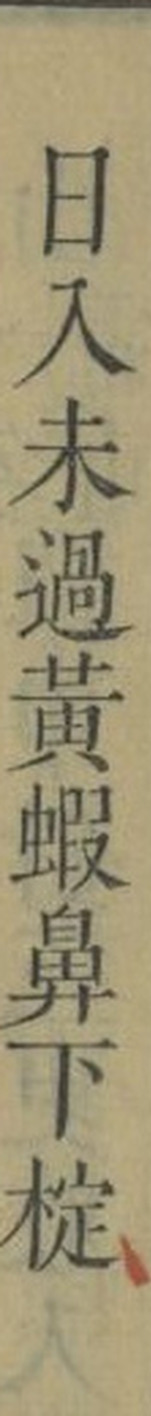日入未過黃蝦鼻下椗
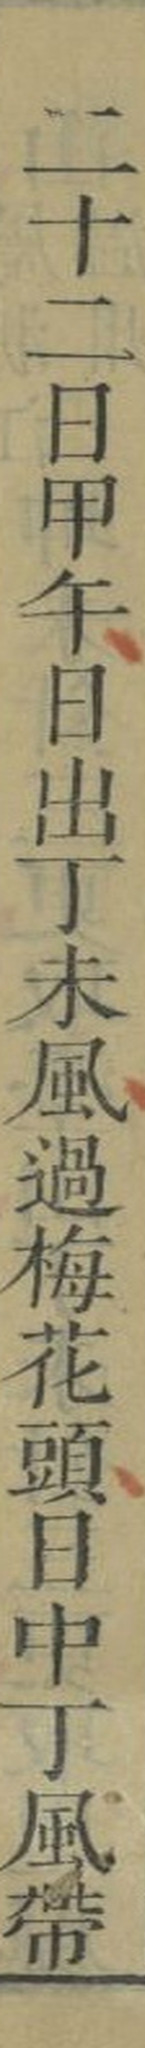二十二日甲午日出丁未風過梅花頭日中丁風帶
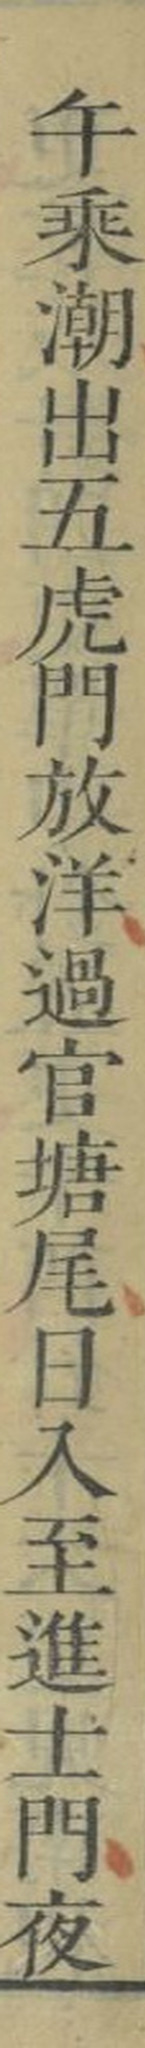午乘潮出五虎門放洋過官塘尾日入至進士門夜
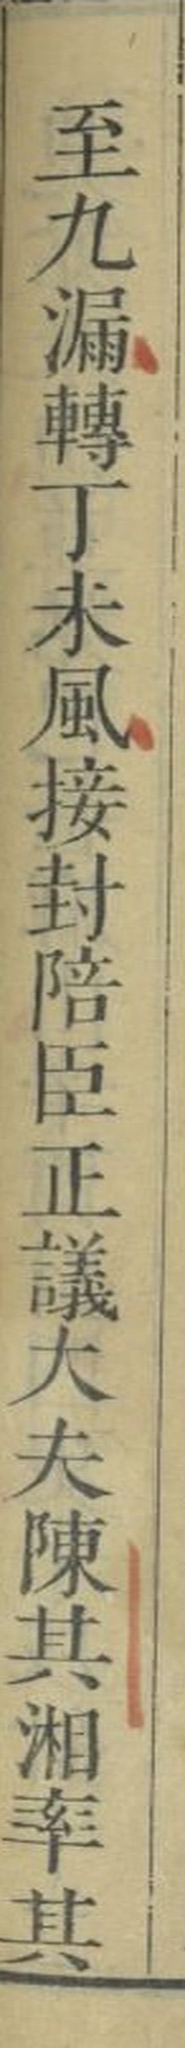至九漏轉丁未風接封陪臣正議大夫陳其湘率其
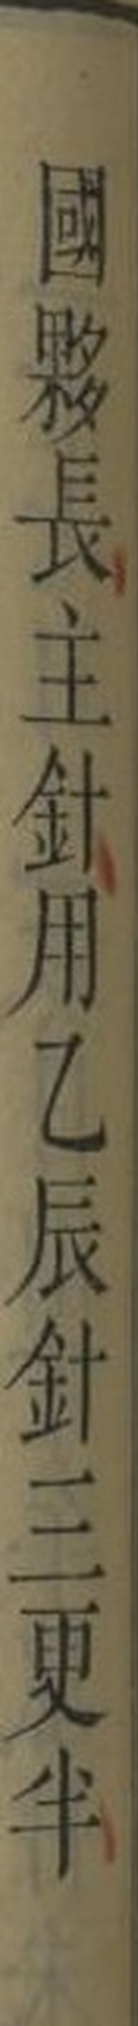國夥長主針用乙辰針三更半
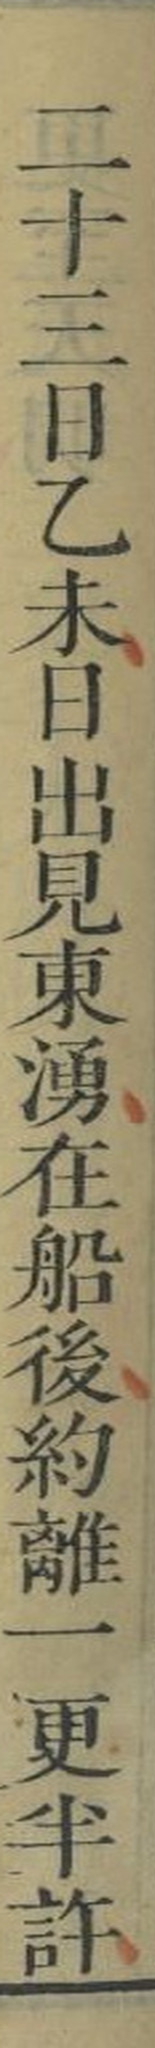二十三日乙未日出見東湧在船後約離一更半許
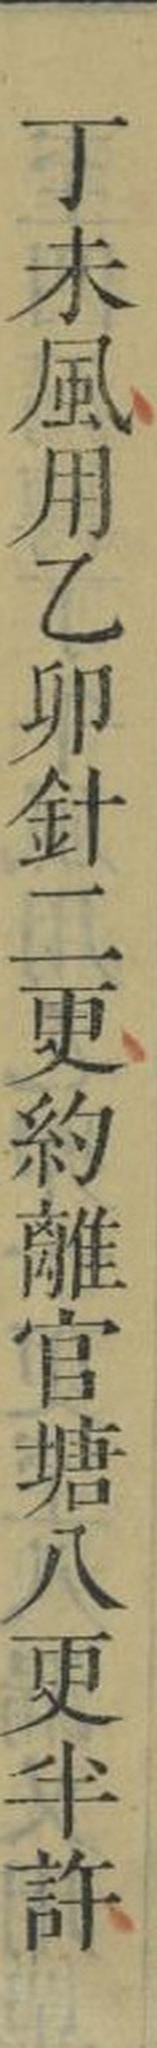丁未風用乙卯針二更約離官塘八更半許
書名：中山伝信録 巻一、巻二
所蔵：University of the Ryukyus Library
